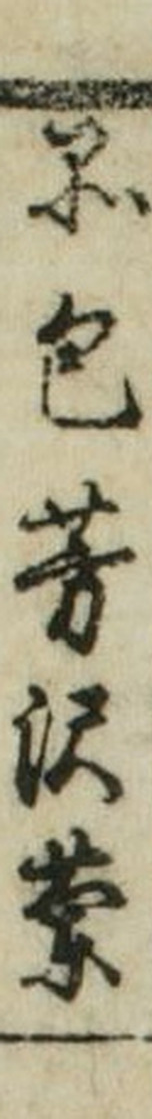品包芳沢蘭
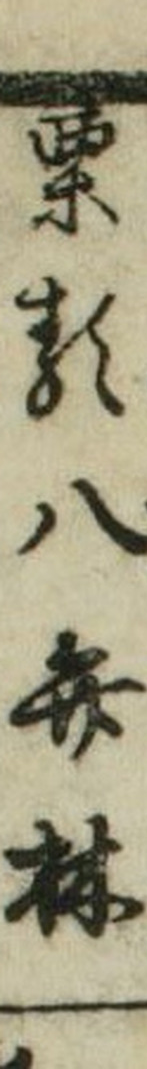栗類八弁林
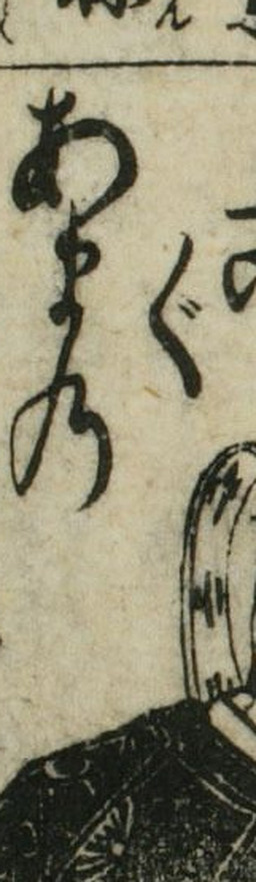あまの
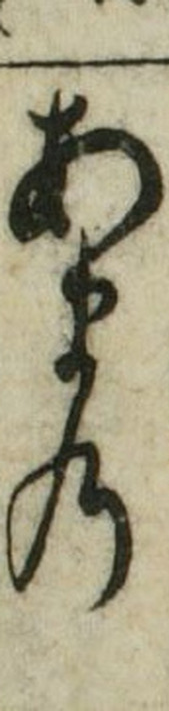あまの
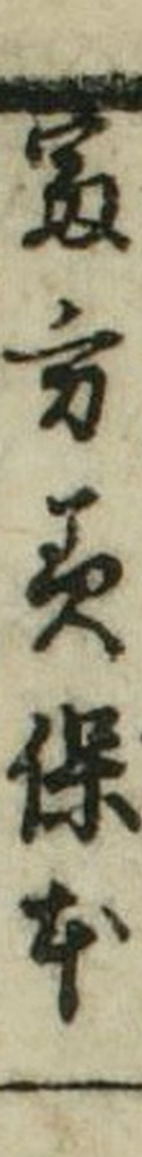富方美保本
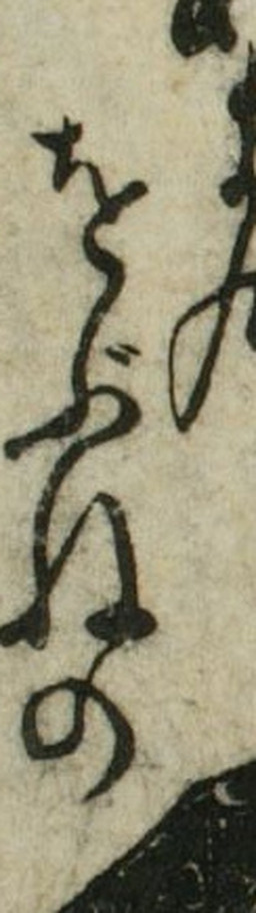をぶねの
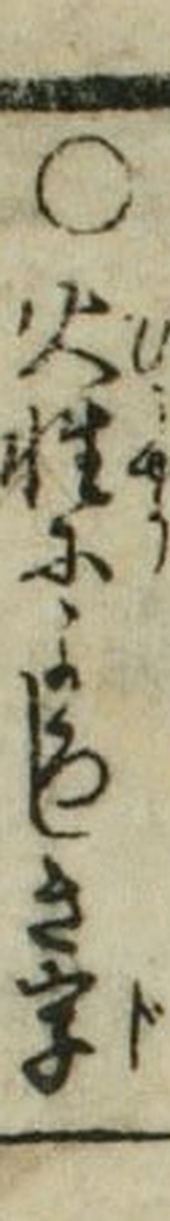○火性によろしき字
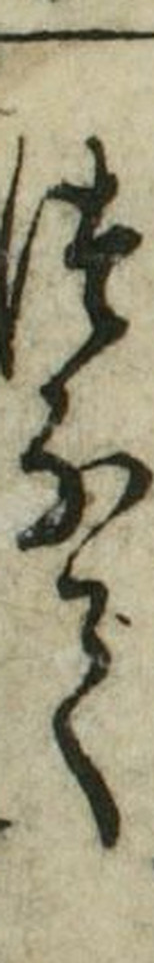つなで
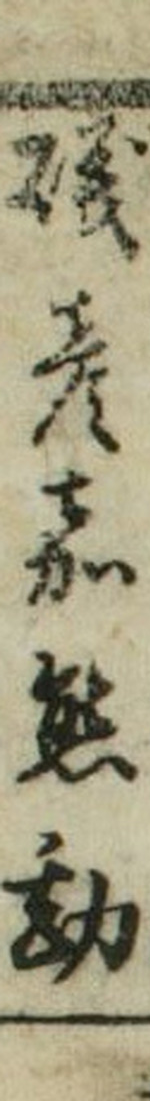磯彦嘉熊勘

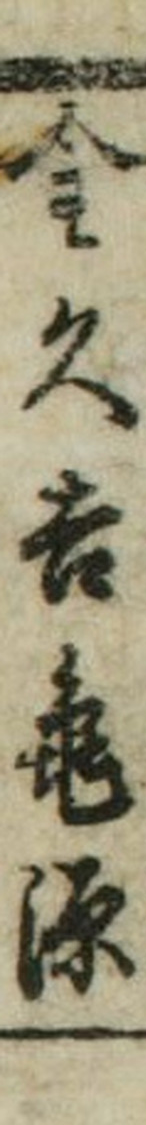金久吉亀源
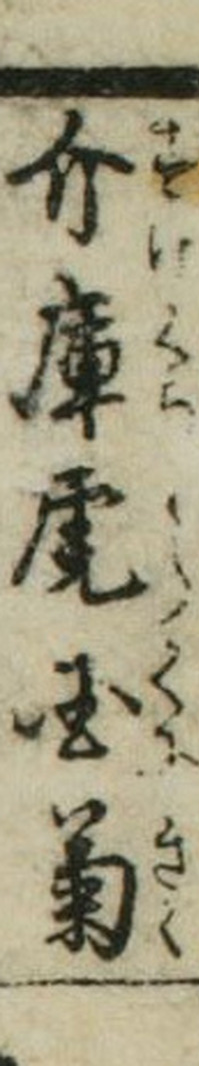介庫虎国菊
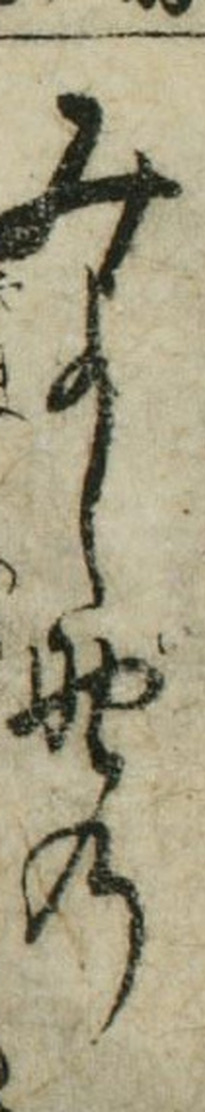みよし野の
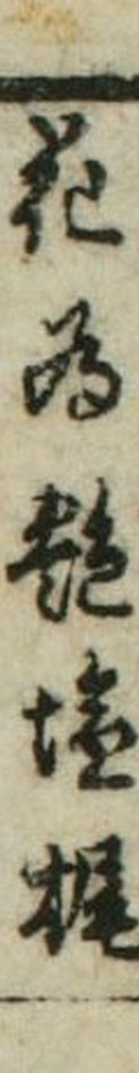花為艶塩梶
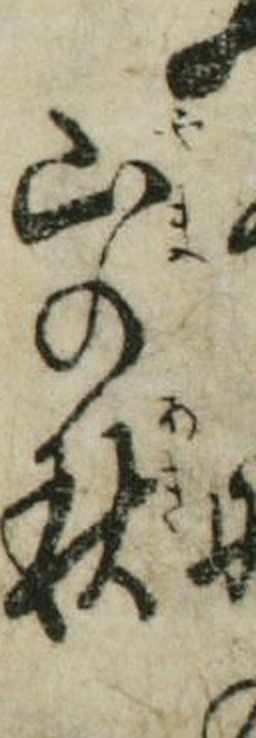山の秋
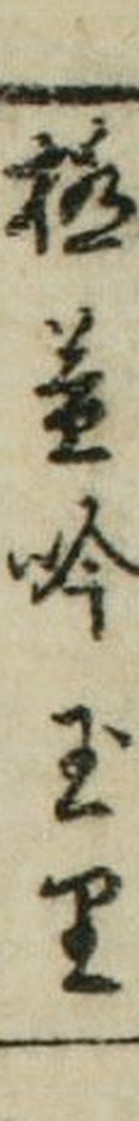極益吟玉里
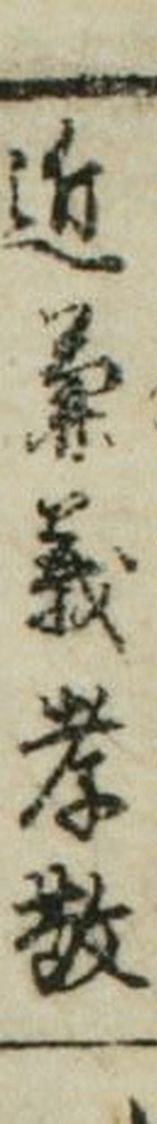近兼義孝敬
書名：百人一首
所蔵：東京学芸大学教育コンテンツアーカイブ
